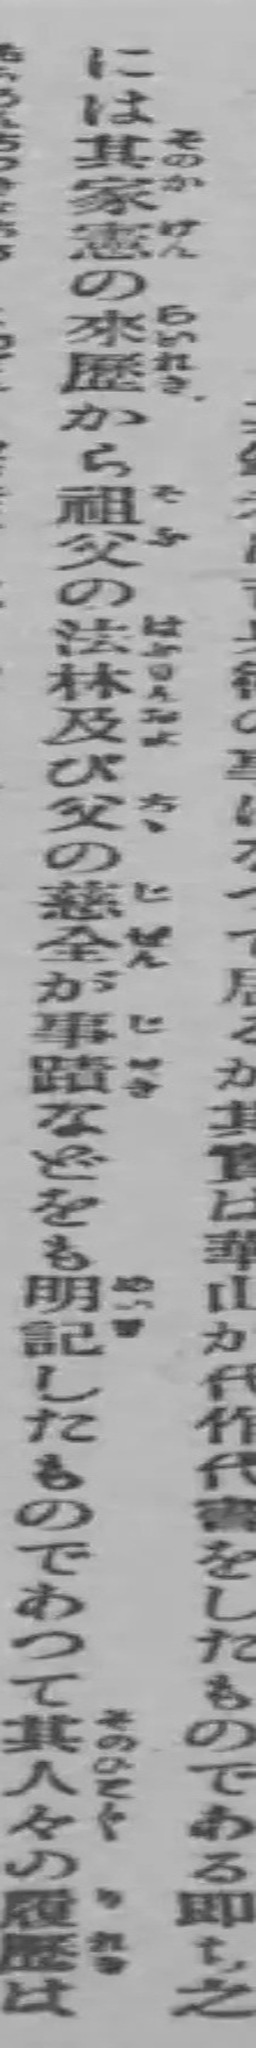には其家憲の来歴から祖父の法林及び父の慈全が事蹟などをも明記したものであつて其人々の履歴は
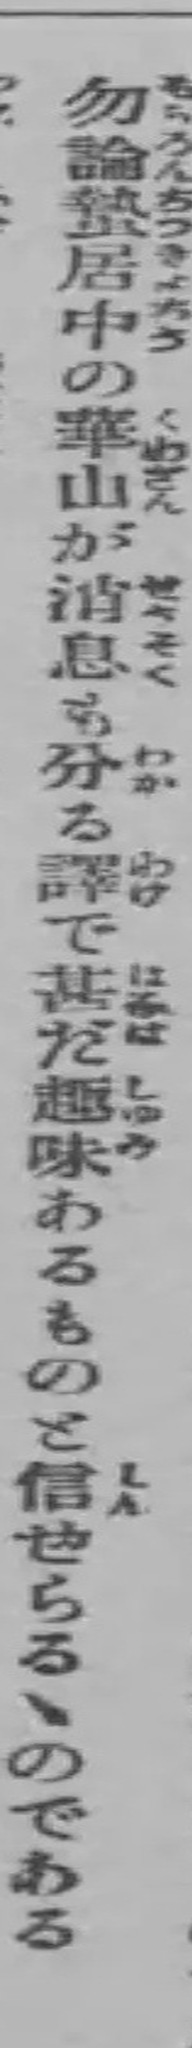勿論蟄居中の崋山が消息も分る訳で甚だ趣味あるものと信ぜらるゝのである
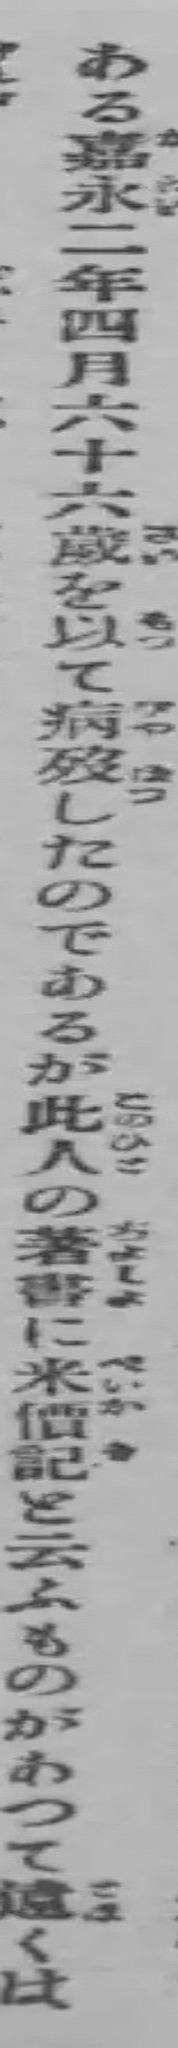ある嘉永二年四月六十六歳を以て病没したのであるが此人の著書に米価記と云ふものがあつて遠くは
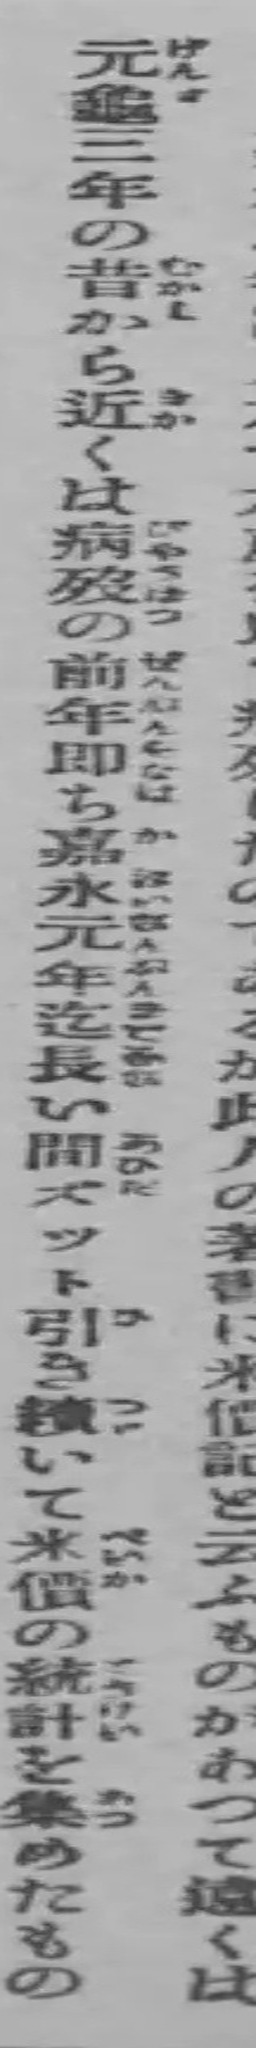元亀三年の昔から近くは病没の前年即ち嘉永元年迄長い間ズツト引き続いて米価の統計を集めたもの
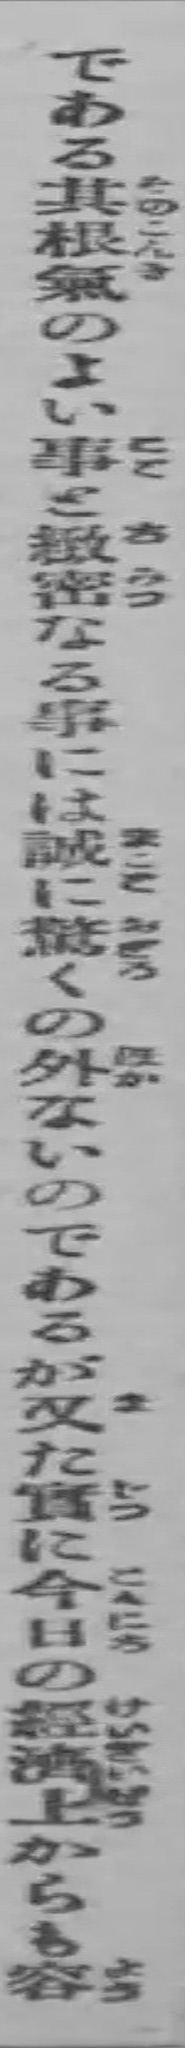である其根気のよい事と緻密なる事には誠に驚くの外ないのであるが又た実に今日の経済上からも容
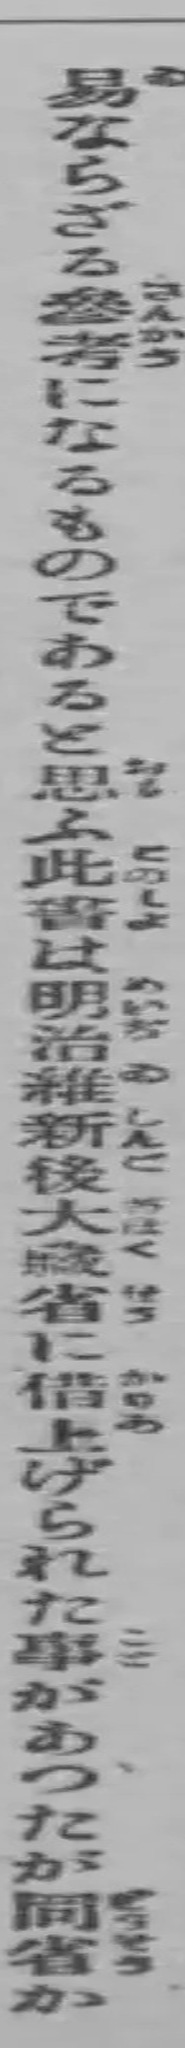易ならざる参考になるものであると思ふ此書は明治維新後大蔵省に借上げられた事があつたが同省か
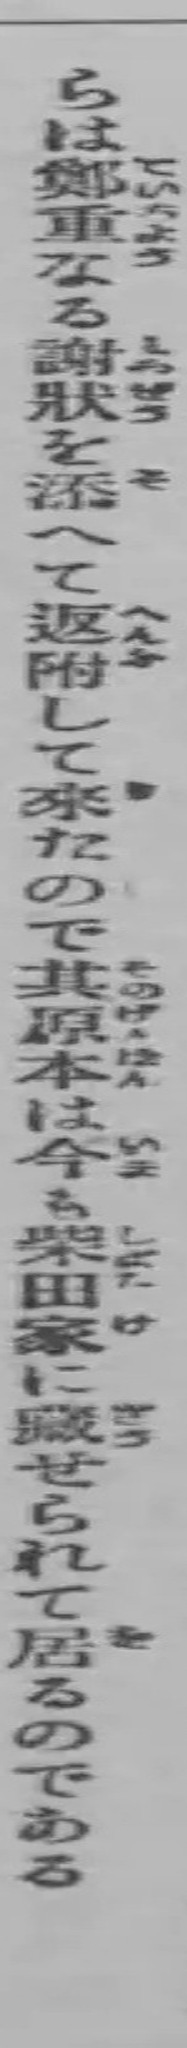らは鄭重なる謝状を添へて返附して来たので其原本は今も柴田家に蔵せられて居るのである
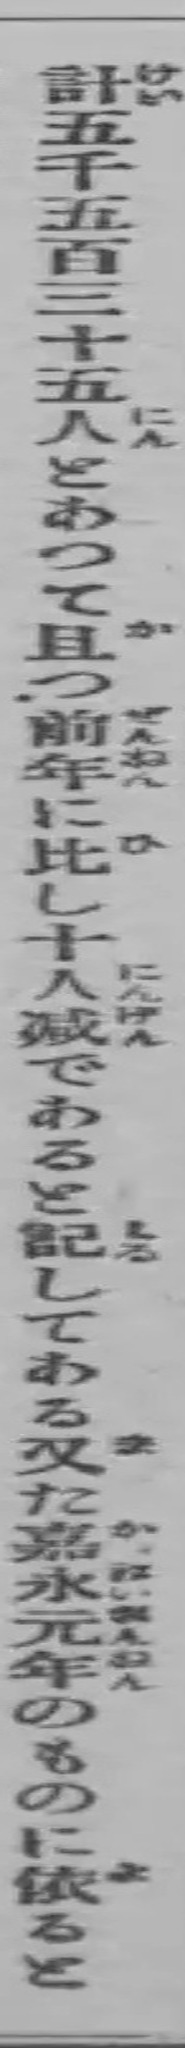計五千五百三十五人とあつて且つ前年に比し十人減であると記してある又た嘉永元年のものに依ると
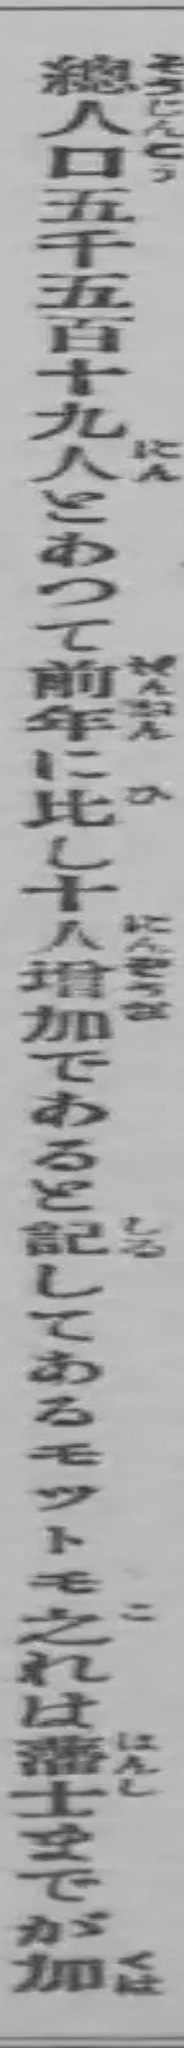総人口五千五百十九人とあつて前年に比し十人増加であると記してあるモツトモ之れは藩士までが加
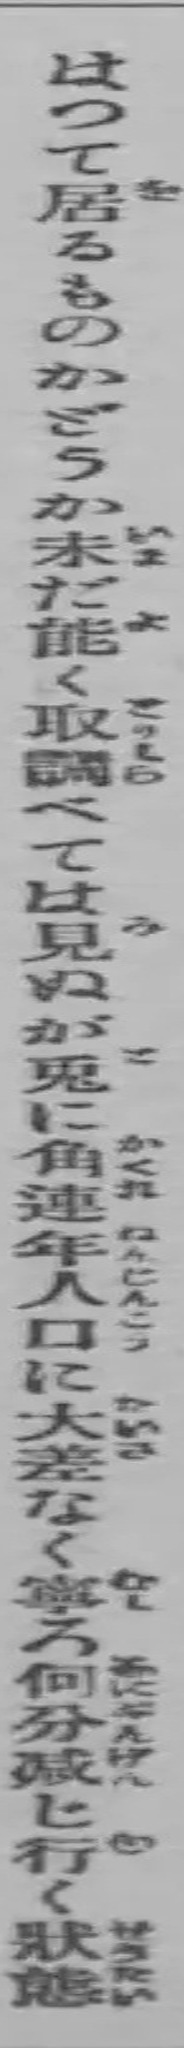はつて居るものかどうか未だ能く取調べては見ぬが兎に角連年人口に大差なく寧ろ何分減じ行く状態
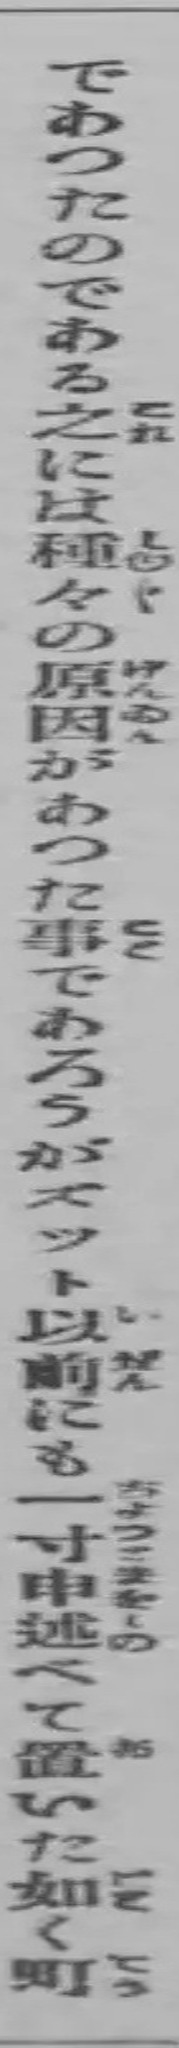であつたのである之には種々の原因があつた事であろうがズツト以前にも一寸申述べて置いた如く町
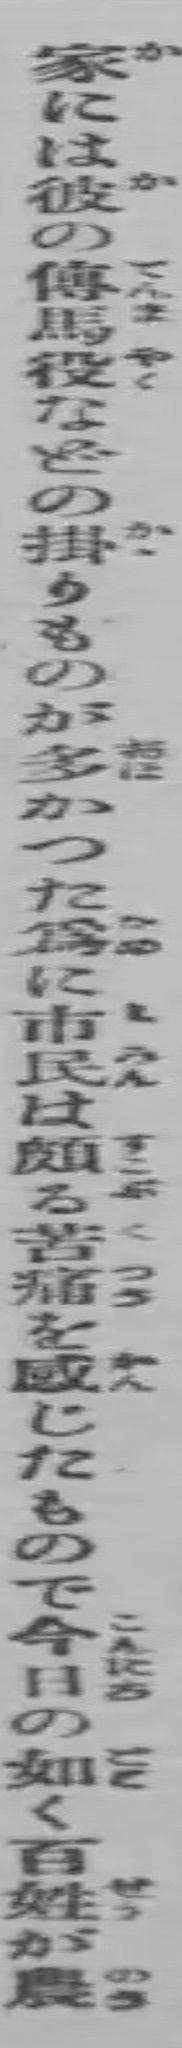家には彼の伝馬役などの掛りのものが多かつた為に市民は頗る苦痛を感じたもので今日の如く百姓が農
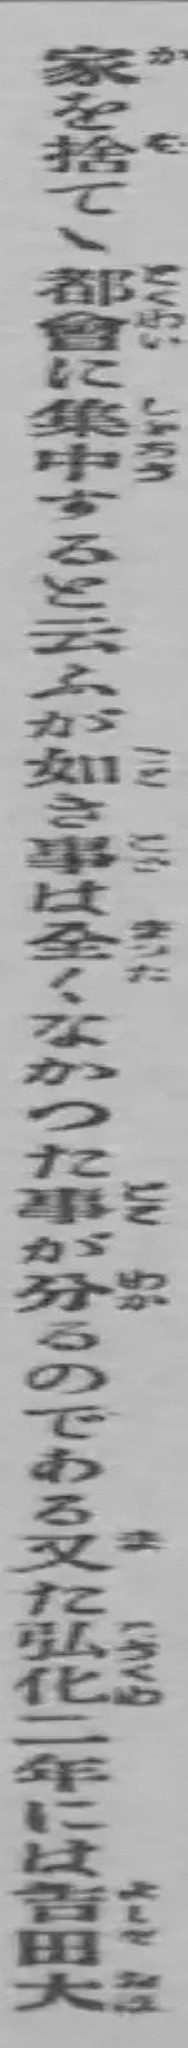家を捨てゝ都会に集中すると云ふが如き事は全くなかつた事が分るのである又た弘化二年には吉田大
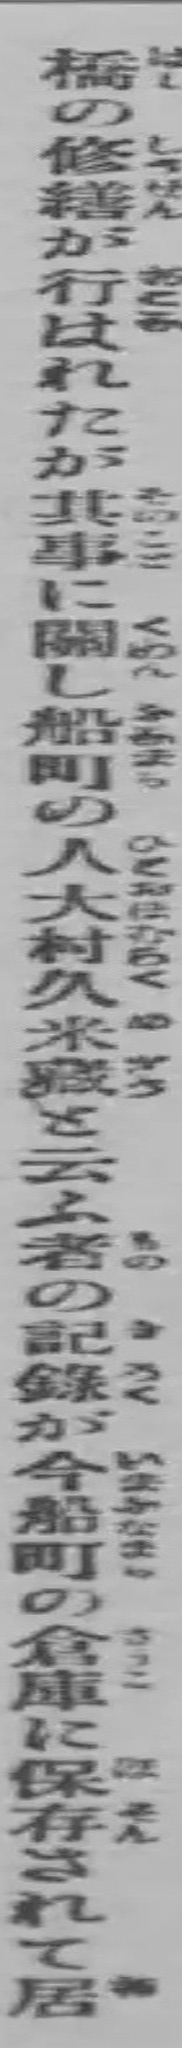橋の修繕が行はれたが其事に関し船町の人大村久米蔵と云ふ者の記録が今船町の倉庫に保存されて居
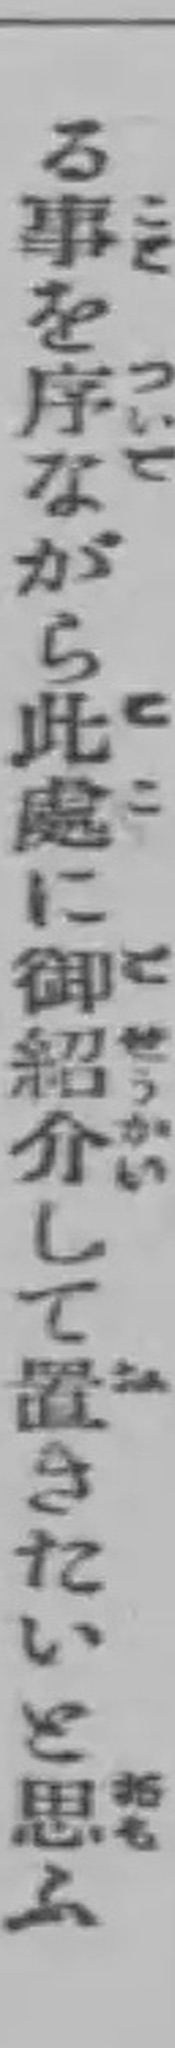る事を序ながら此処に御紹介して置きたいと思ふ
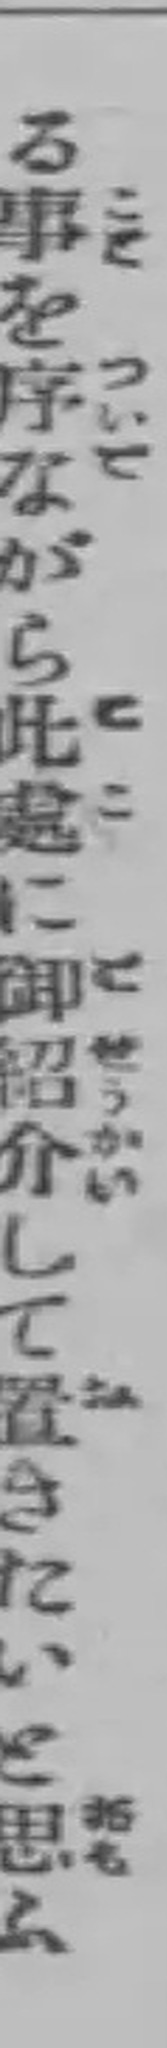る事を序ながら此処に御紹介して置きたいと思ふ
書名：豊橋市史談
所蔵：国立国会図書館 National Diet Library, JAPAN
